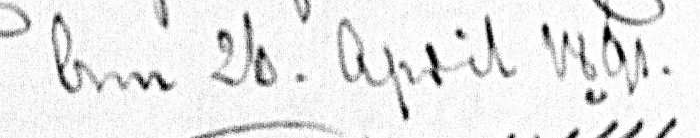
Am 26. April 1891
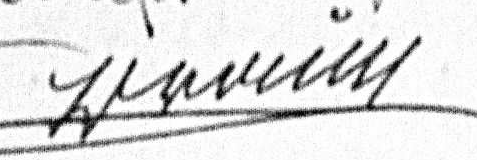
Wraun
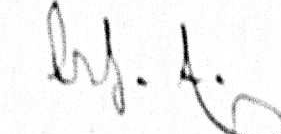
AE
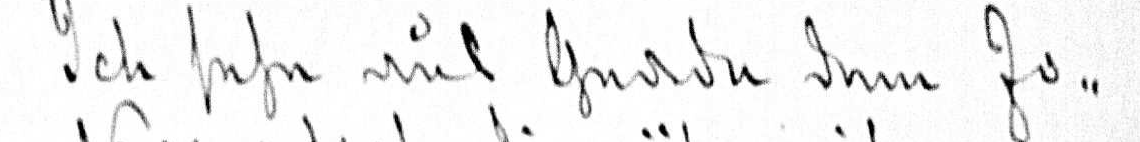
Ich sehe aus Gnade dem Jo¬
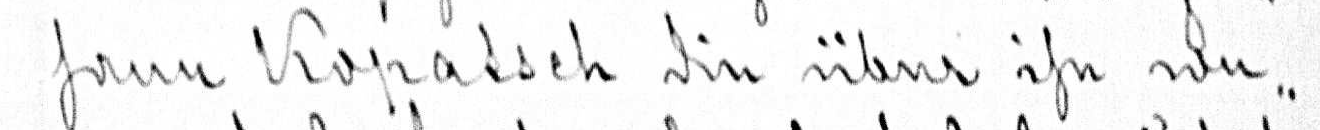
hann Kopatsch die über ihn we¬
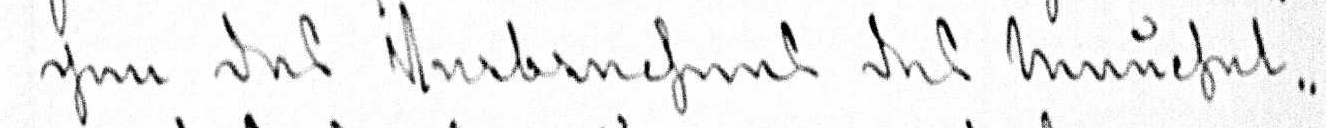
gen des Verbrechens des Meuchel¬
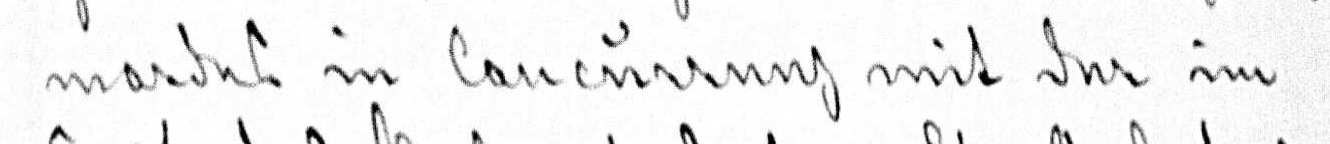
mordes in Concurrenz mit der im
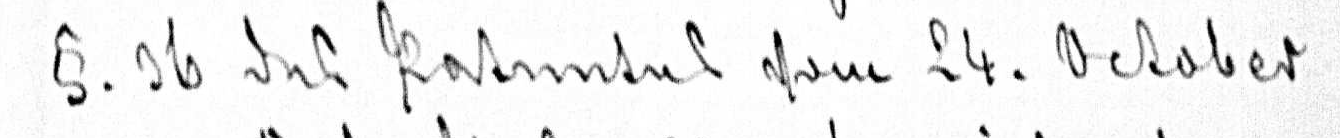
§36 des Patentes vom 24. October
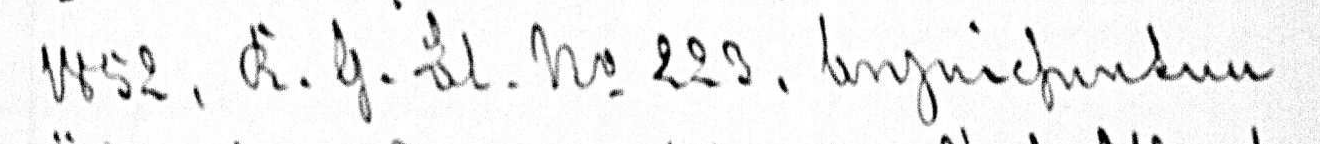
1852 R.G.Bl. No 223, bezeichneten
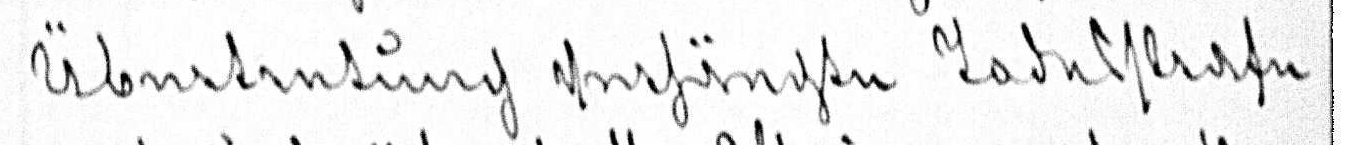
Übertretung verhängte Todesstrafe
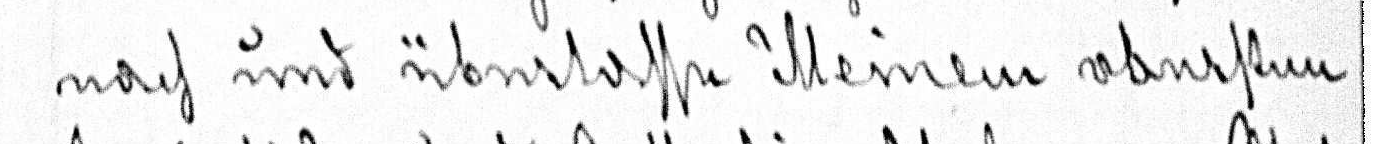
nach und überlasse Meinem obersten
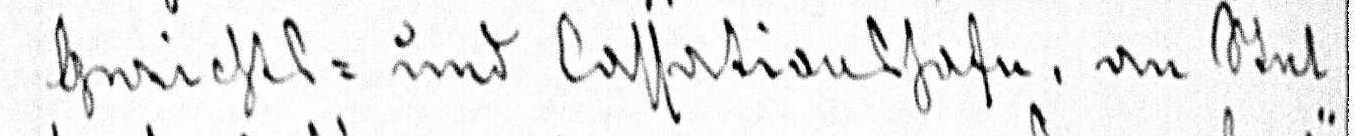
Gerichts- und Cassationshofe, an Stel¬
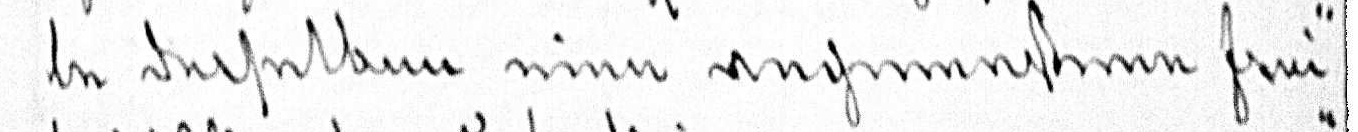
le derselben eine angemeßene Frei¬
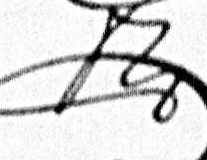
FJ
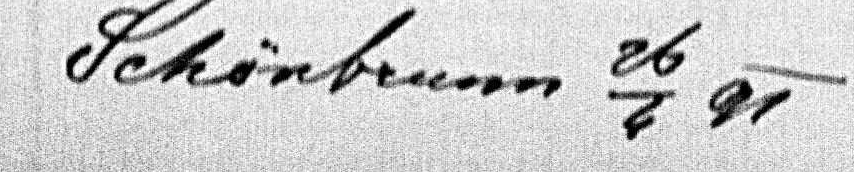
Schönbrunn 26/4/1891
